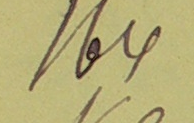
164
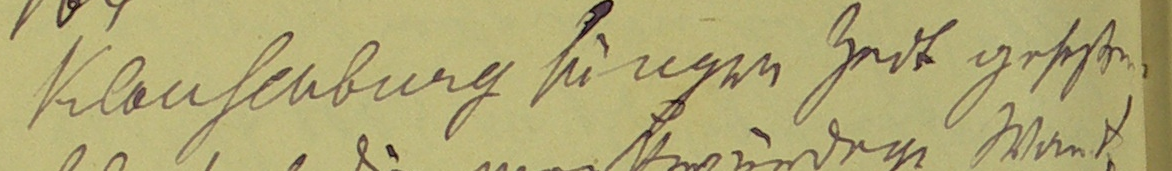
Klausenburg jüngrn Zeidt gesehen,
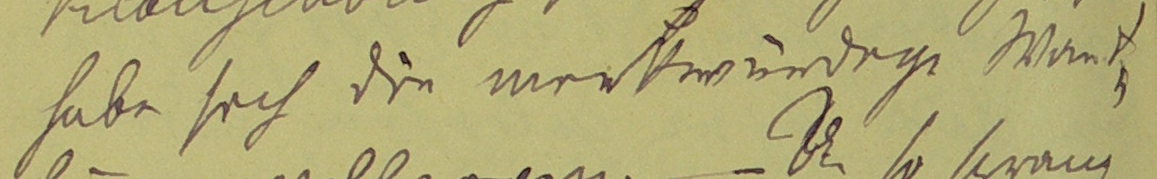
habe sich die merkwürdige Wand¬
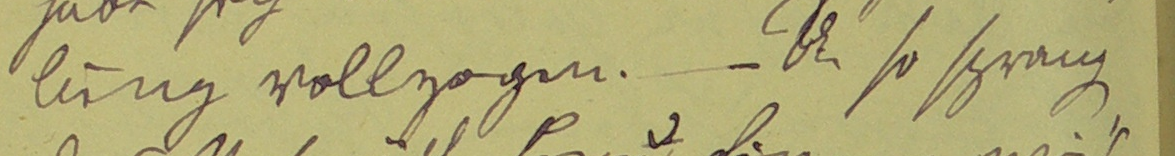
lung vollzogen.—Und so sprang
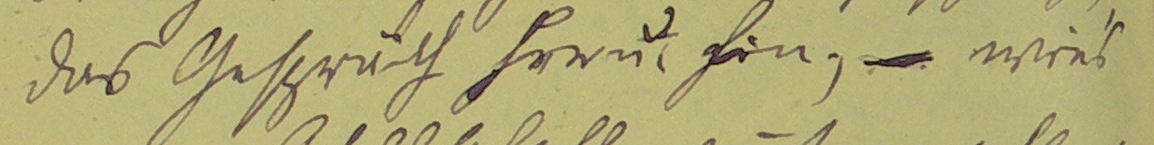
das Gespräch her und hin;- wies
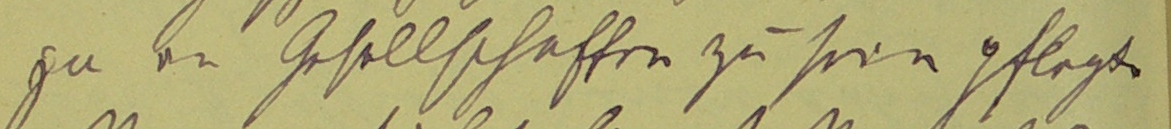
so in Gesellschaften zu sein pflegte.
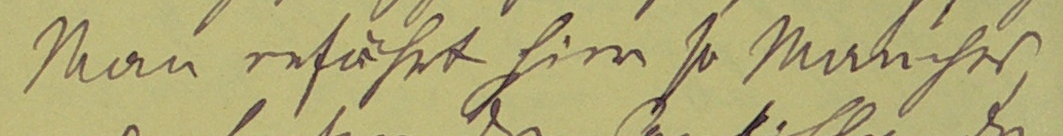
Man erfährt hier so manches
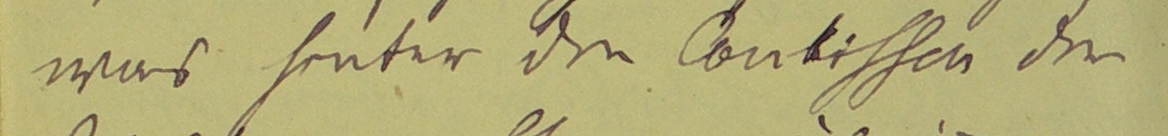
was in den Coulissen der
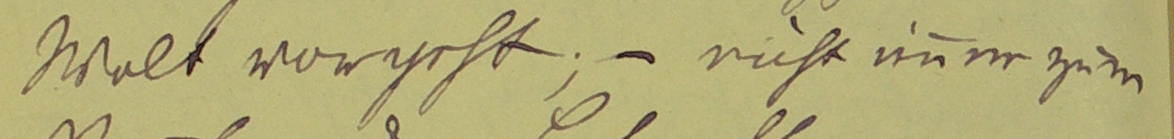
Welt vorgeht,-Nicht immer zum
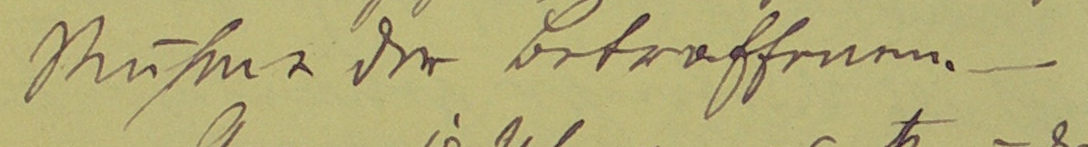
Ruhme der Betroffenen.—
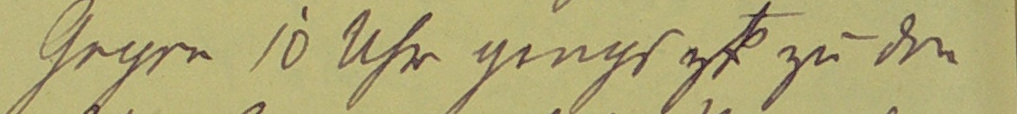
Gegen 10 Uhr gings zusammen zu den
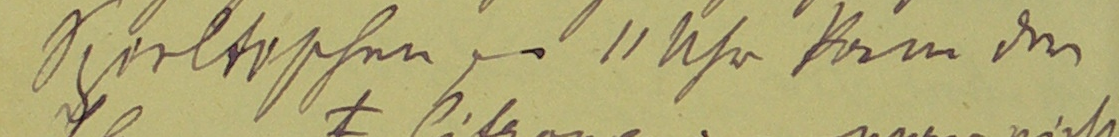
Spieltischen,- 11 Uhr kam der
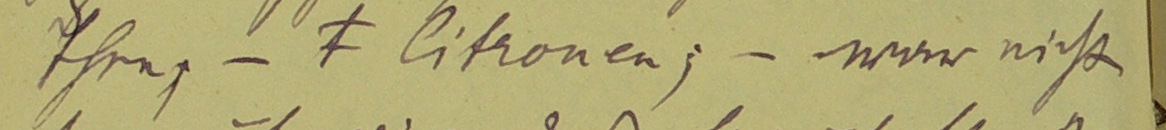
Thee ,- mit Citrone; - war nicht
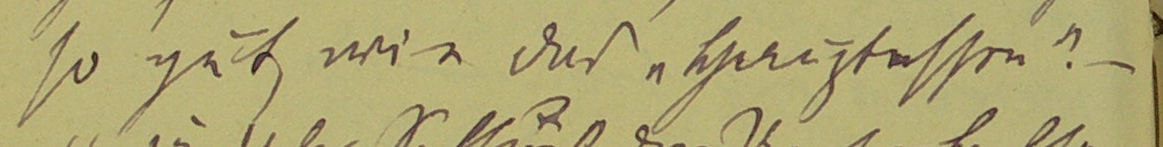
so gut wie das „Hauptessen“
